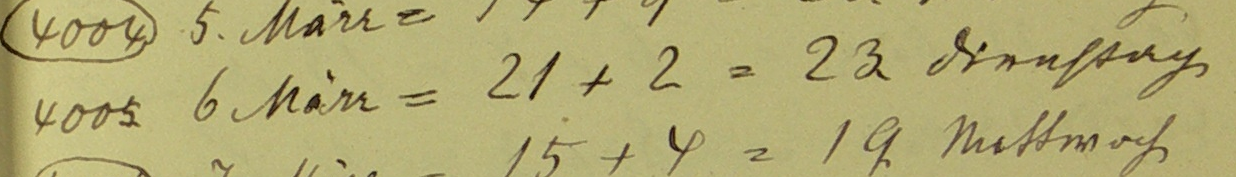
4005 6. März = 21 + 2 = 23. Dienstag
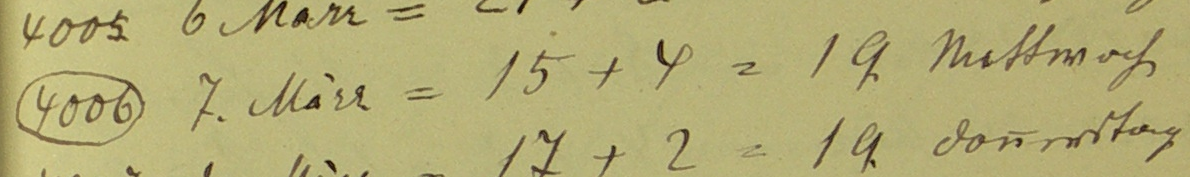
4006 7. März = 15 + 4 = 19. Mittwoch
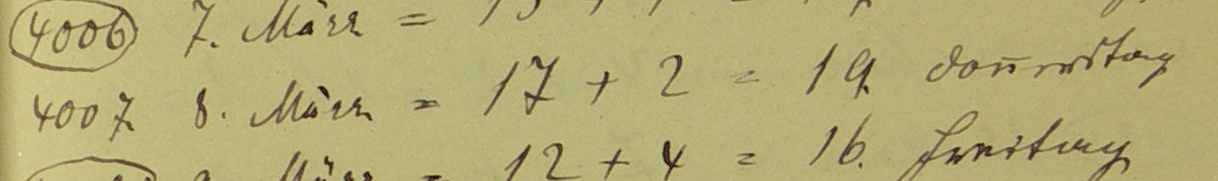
4007 8. März = 17 + 2 = 19. Donnerstag
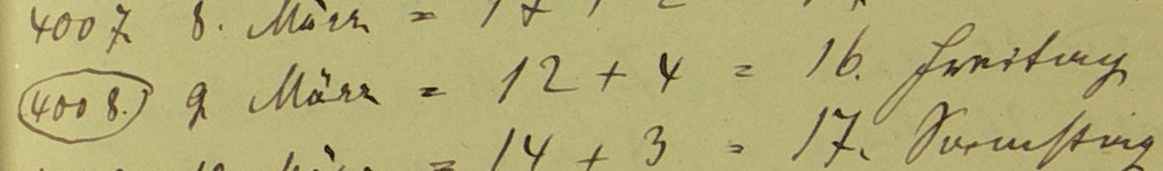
4008 9. März = 12 + 4 = 16. Freitag
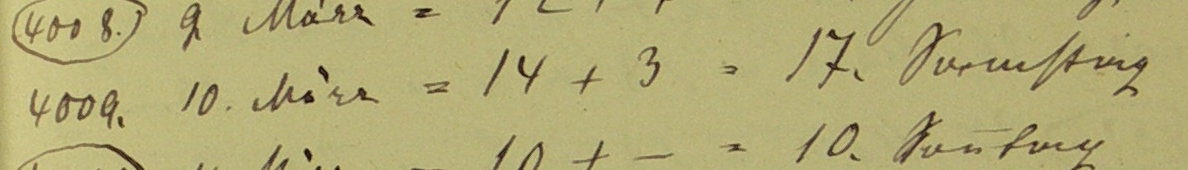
4009 10. März = 14 + 3 = 17. Samstag
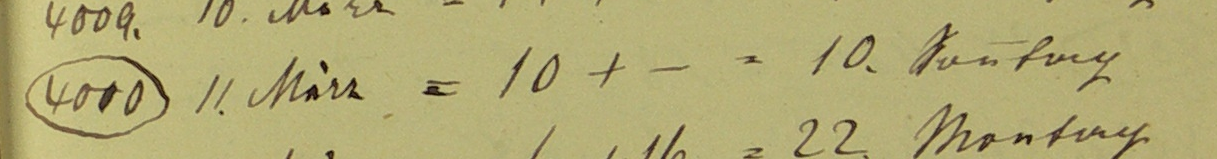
4010 11. März = 10 + 0 = 10. Sonntag
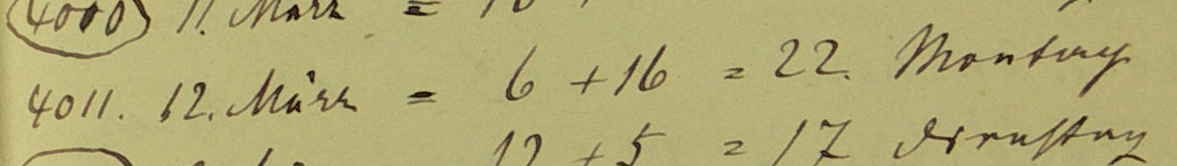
4011 12. März = 6 + 16 = 22. Montag
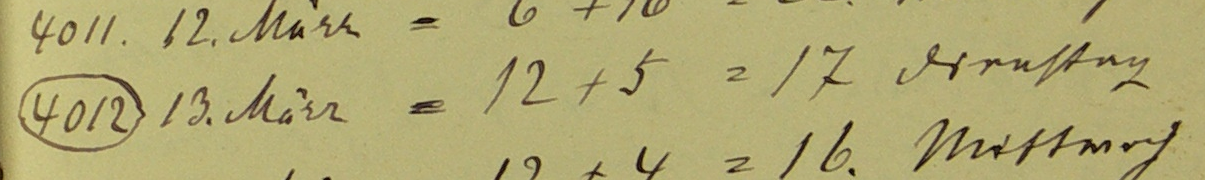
4012 13. März = 12 + 5 = 17 Dienstag
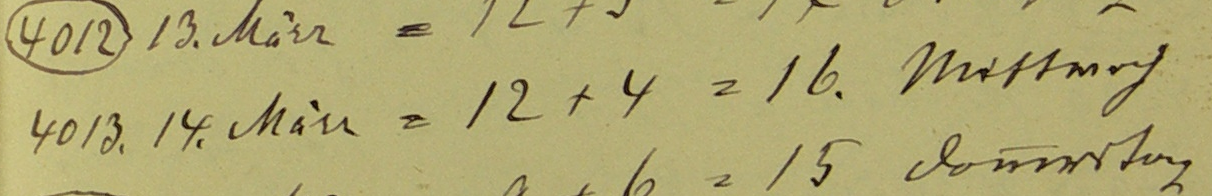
4013 14. März = 12 + 4 = 16. Mittwoch
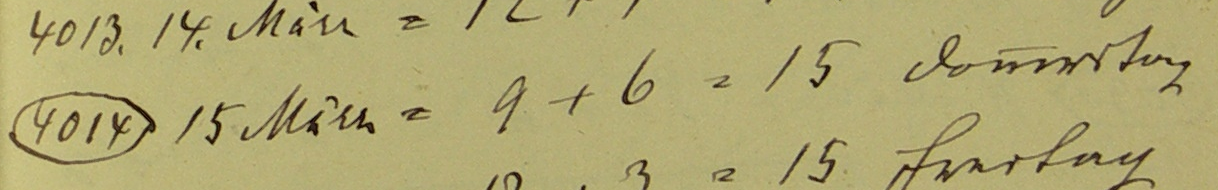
4014 15. März = 9 + 6 = 15. Donnerstag
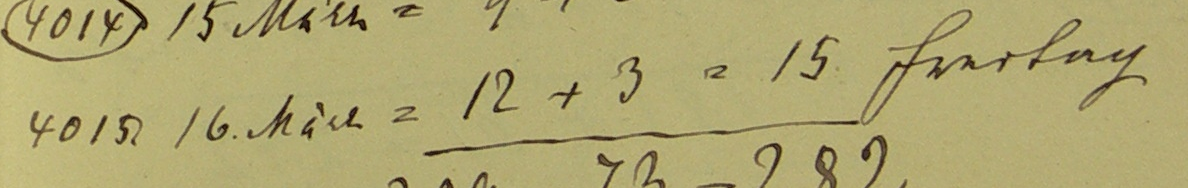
4015 16. März = 12 + 3 = 15. Freitag
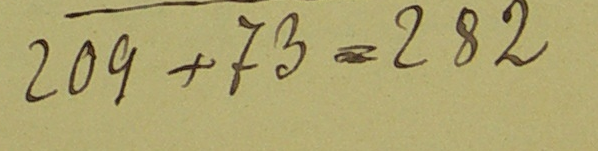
209 + 73 = 282
